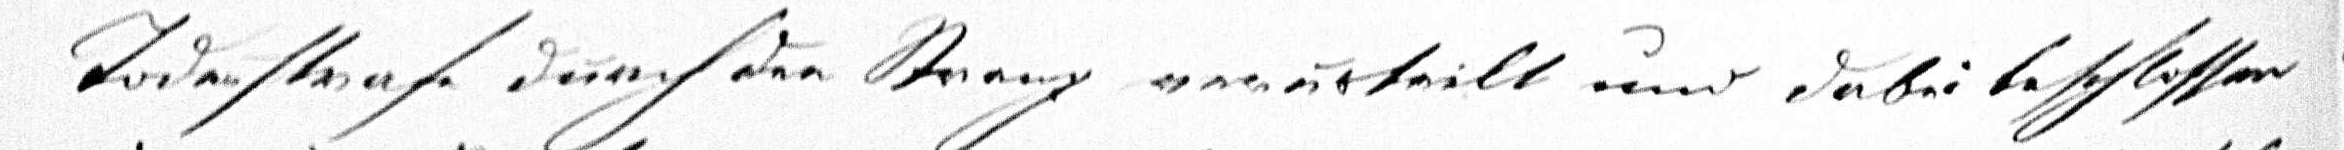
Todesstrafe durch den Strang verurtheilt und dabei beschlossen
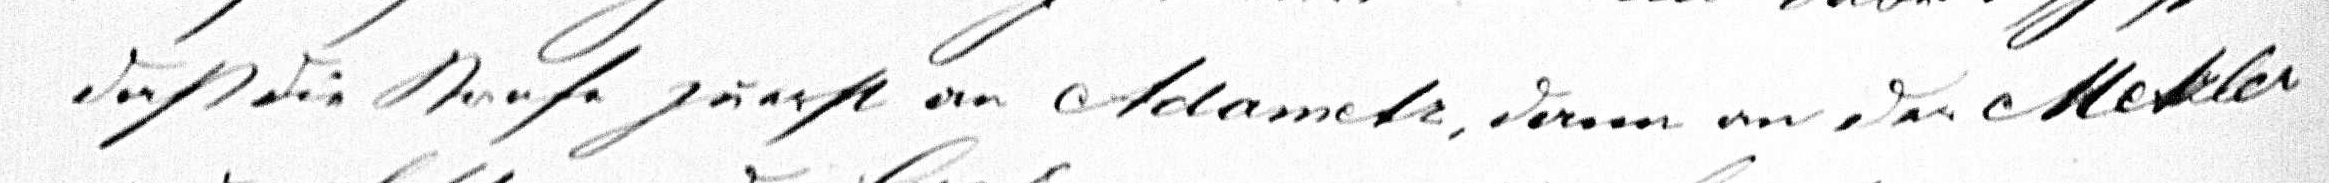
daß die Strafe zuerst an Adametz, dann an der Metzler
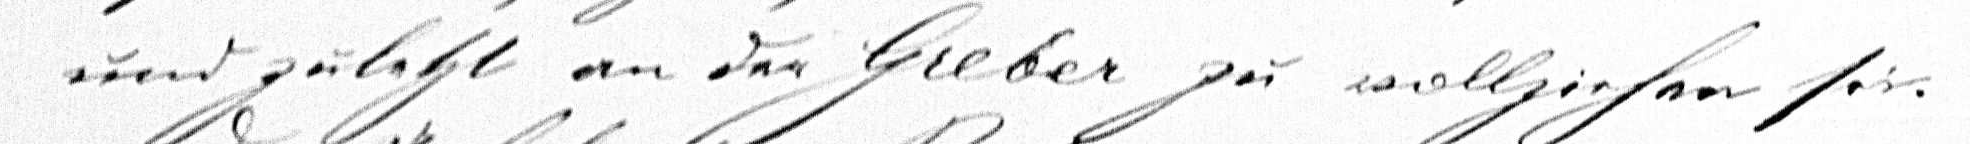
und zuletzt an der Greber zu vollziehen sei.
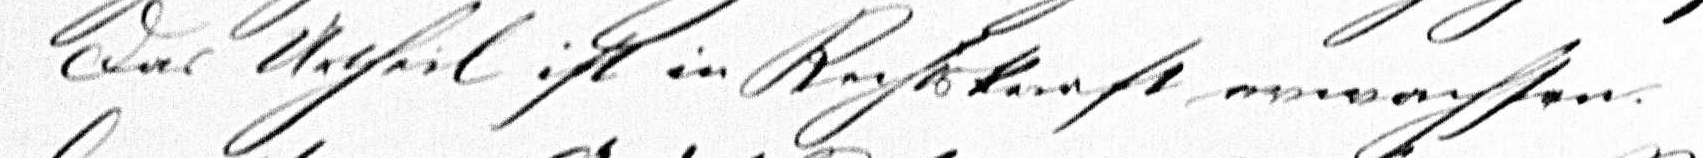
Das Urtheil ist in Rechtskraft erwachsen.
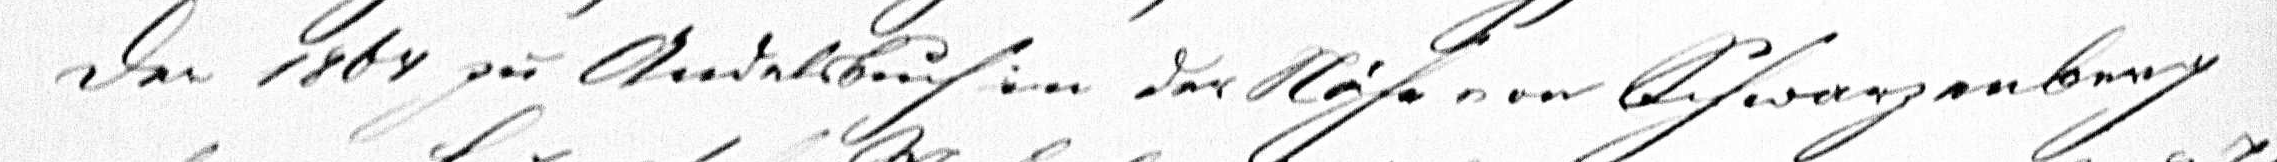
Der 1864 zu Andelsbuch in der Nähe von Schwarzenberg
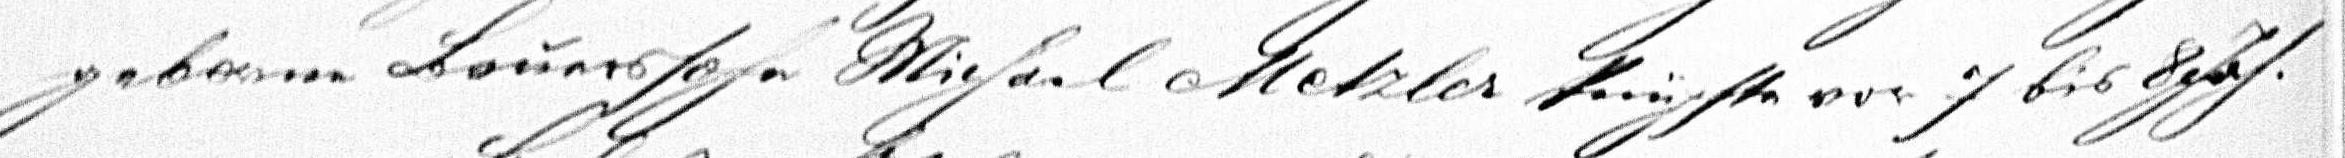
geborene Bauerssohn Michael Metzler knüpfte vor 7 bis 8 Jah¬
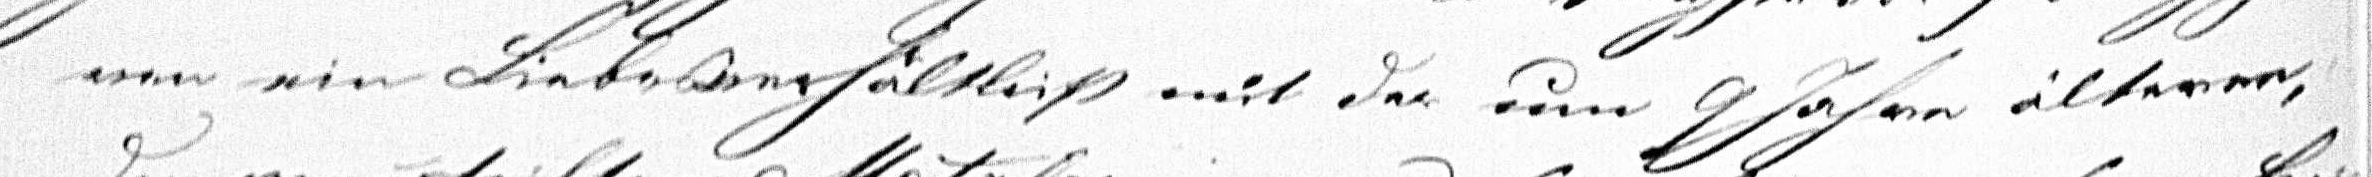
ren ein Liebesverhältniß mit der um 9 Jahre älteren,
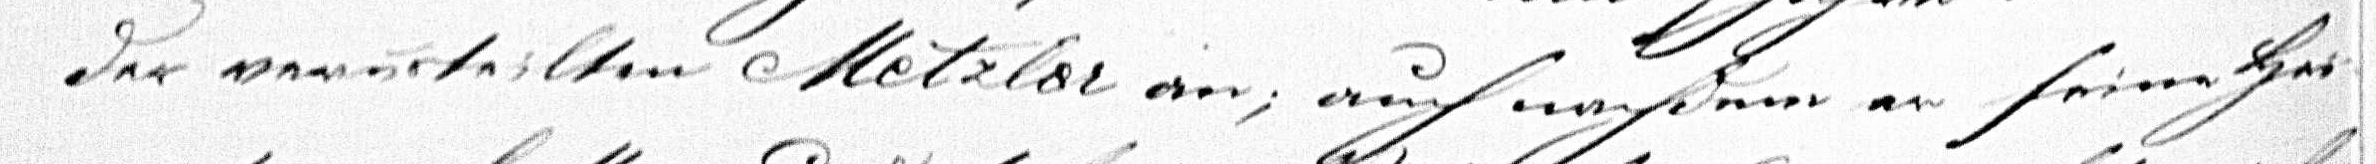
der verurtheilten Metzler an; auch nachdem er seine Hei¬
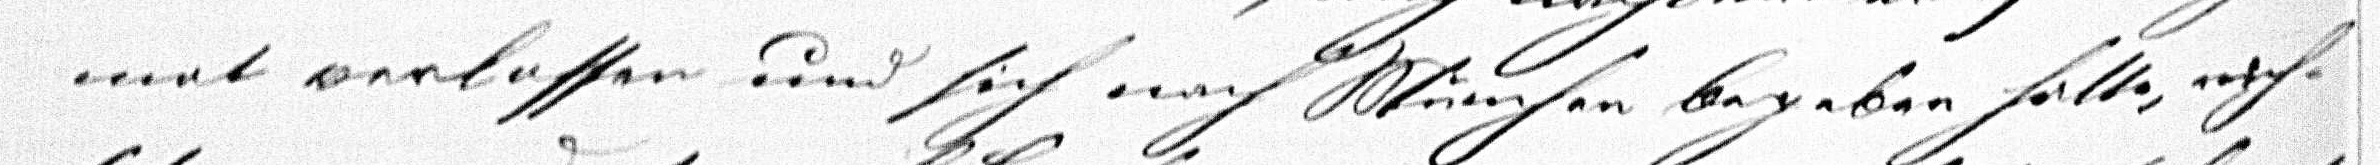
mat verlassen und ist nach München begeben hatte, rich¬
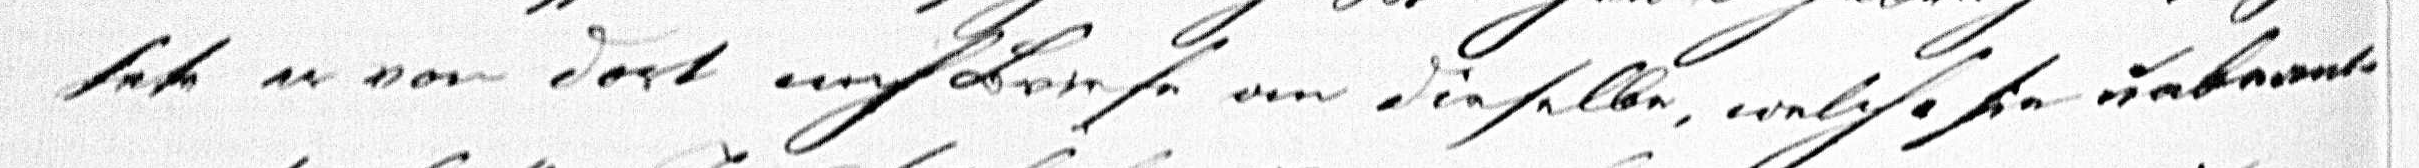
tete er von dort noch Briefe an dieselbe, welche sie unbeant¬
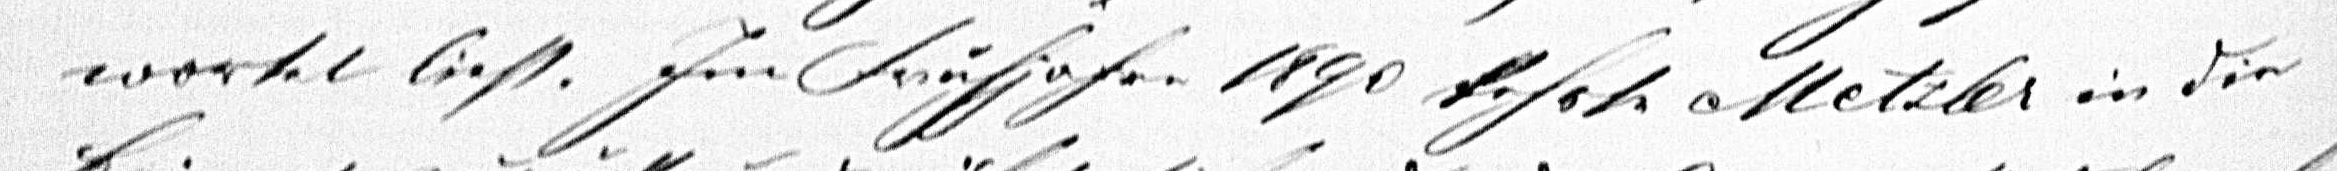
wortet ließ. Im Frühjahr 1890 kehrte Metzler in die
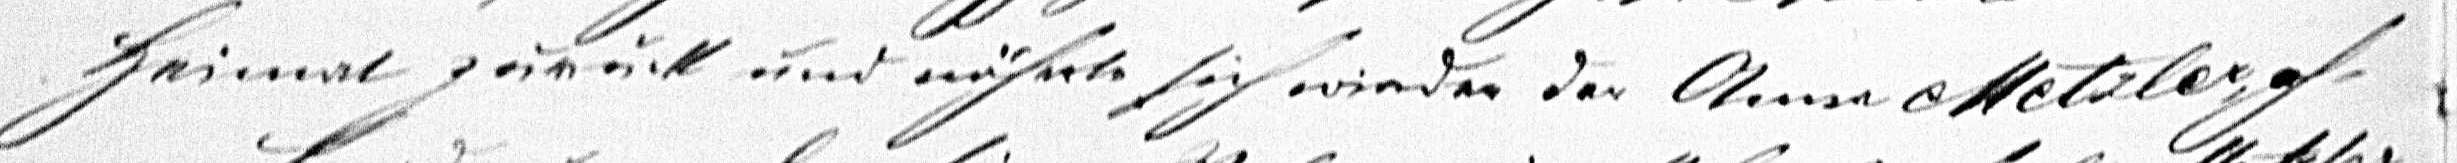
Heimat zurück und nährte sich wieder der Anna Metzler oh¬
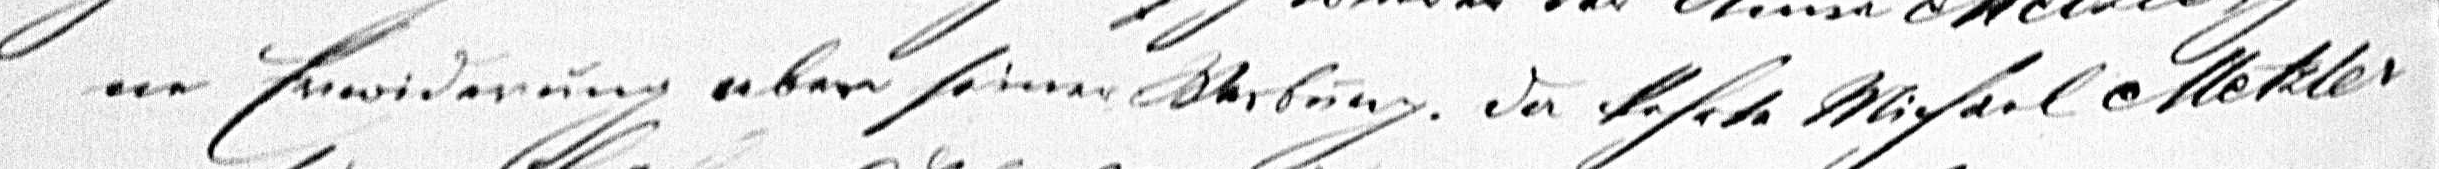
ne Erwiderung aber seiner Werbung. Da kehrte Michael Metzler
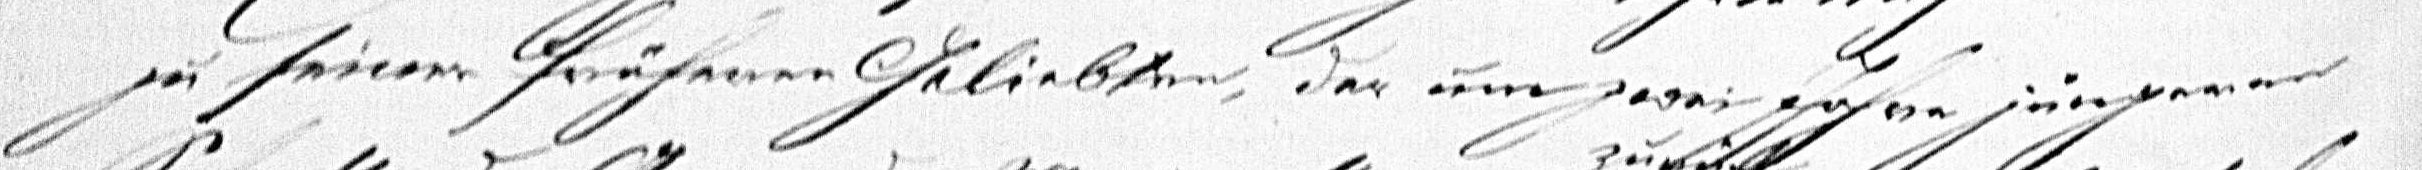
zu seinem früheren Geliebten, der um zwei Jahre jüngeren
